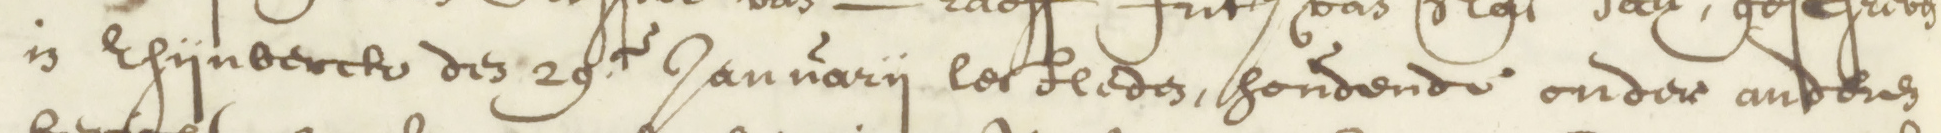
in Rhijnberck den 29en. Januarij lestleden, houdende onder anderen
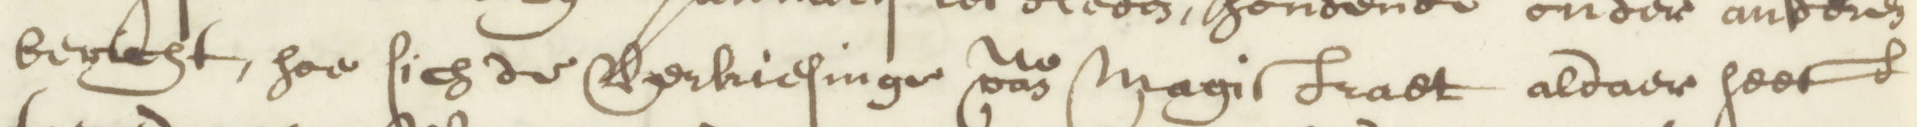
bericht, hoe sich de Verkiesinge van Magistraet aldaer heeft
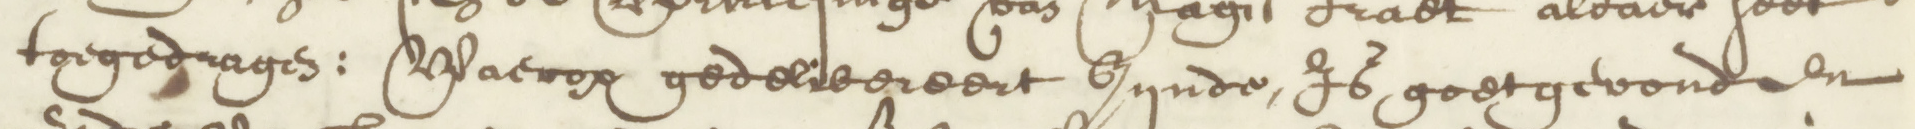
toegedragen: Waerop gedelibereert Zynde, Is goetgevonden
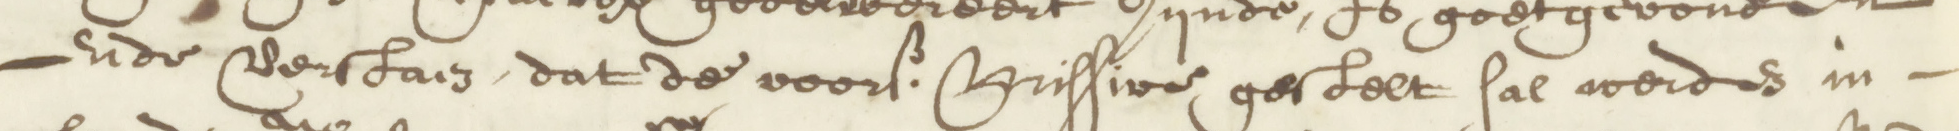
ende Verstaen, dat de voors. Missive gestelt sal worden in —
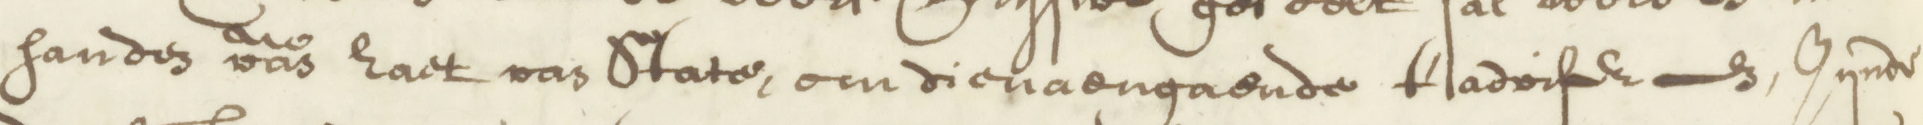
handen van Raet van State, om dienaengaende t'adviseren, Zynde
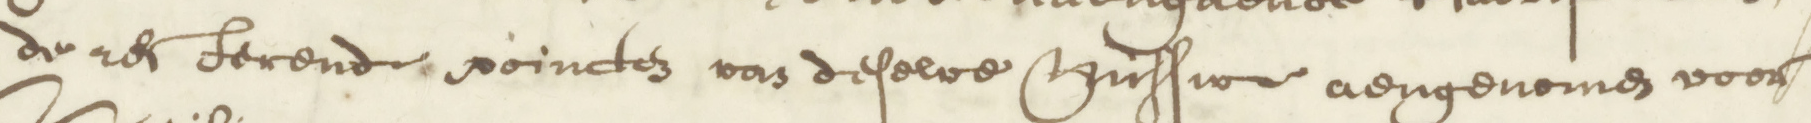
de resterende poincten van deselve Missive aengenomen voor
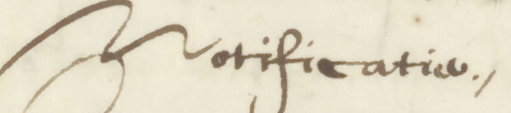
Notificatie.
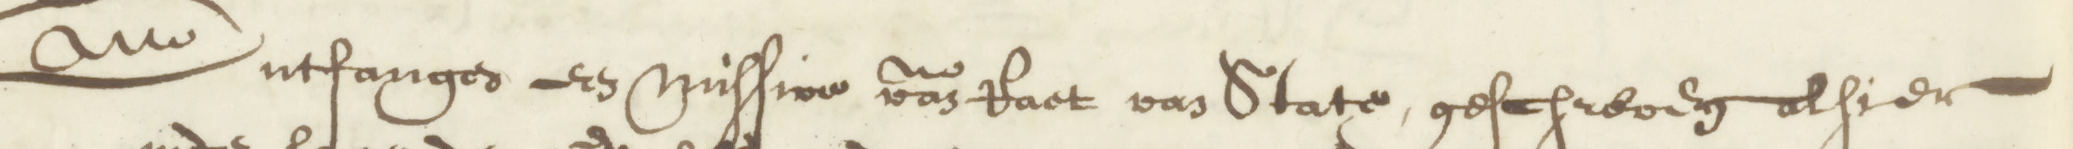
Ontfangen een missive van Raet van State, geschreven alhier
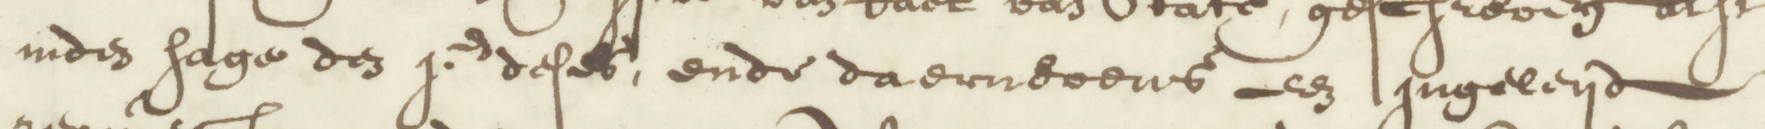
inden hage den 1en. deses, ende daernevens een ingeleyde
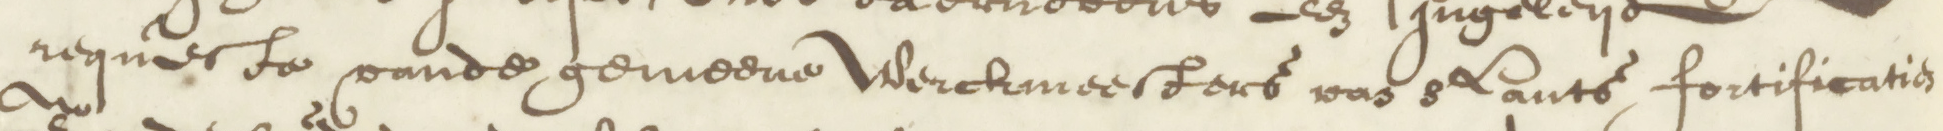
requeste vande gemeene Werckmeesters van sLants fortificatien
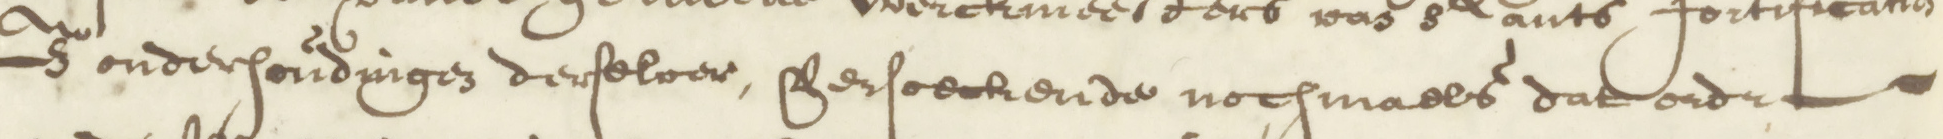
& onderhoudingen derselver, Versoeckende nochmaels dat ordre
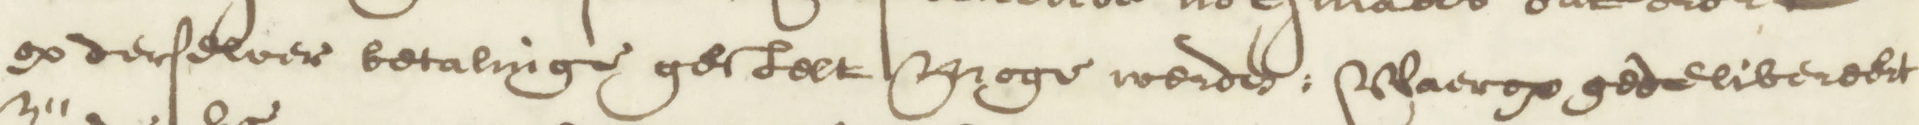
op derselver betalinge gestelt moge werden: Waerop gedelibereert
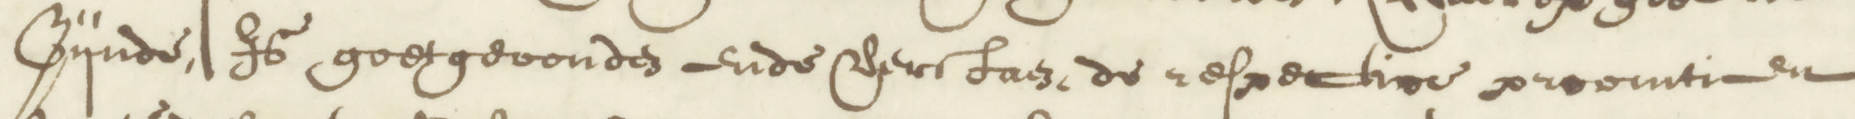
Zijnde, Is goetgevonden ende Verstaen, de respective provintien
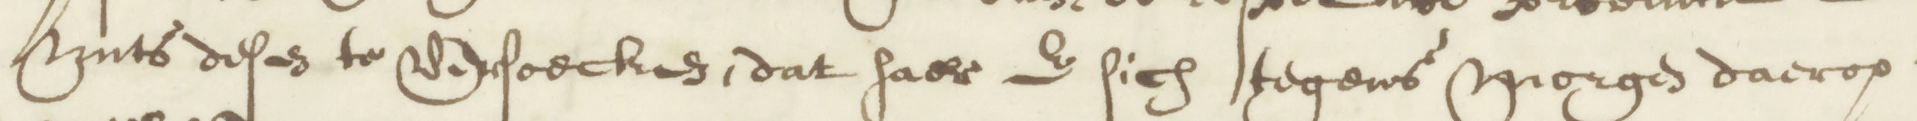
mits desen te Versoecken, dat haer E sich tegens morgen daerop
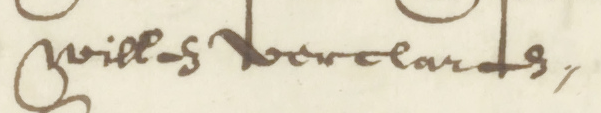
willen verclaren.
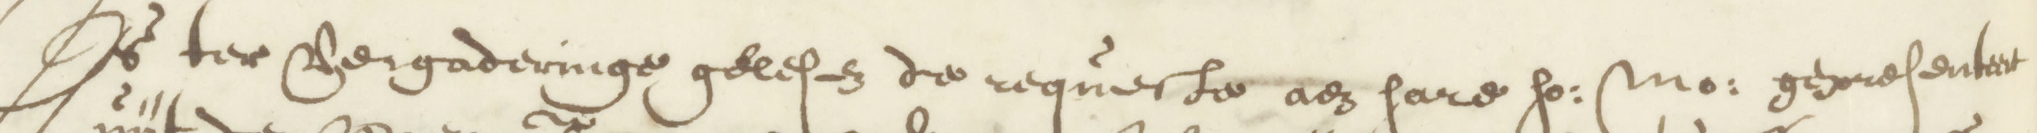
Is ter Vergaderinge gelesen de requeste aen hare ho:Mo: gepresenteert
